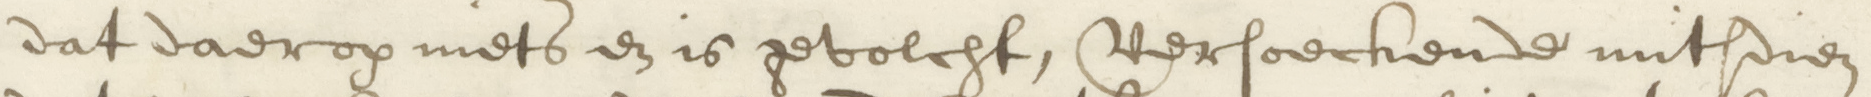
dat daerop niets en is gevolcht, versoeckende misdien
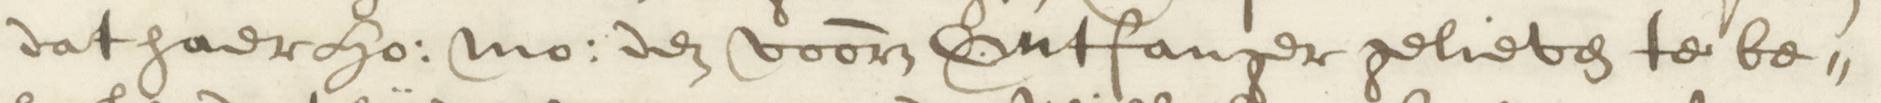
dat haer Ho:Mo: den voorn Ontfanger gelieven te be„
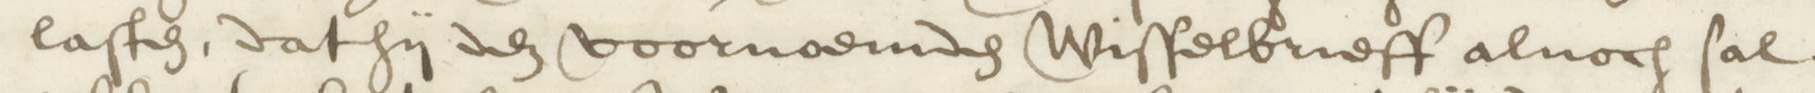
lasten, dat hij den voornoemden wisselbrieff alnoch sal
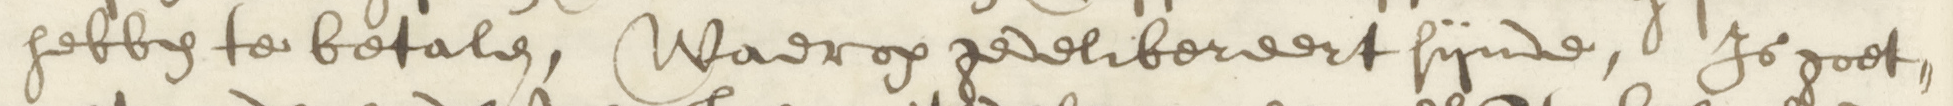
hebben te betalen. Waerop gedelibereert sijnde, Is goet„
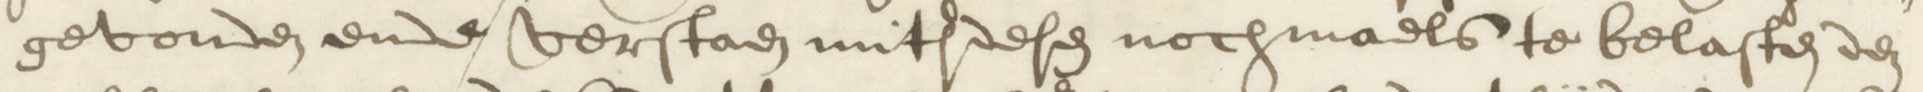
gevonden ende verstaen mitsdesen nochmaels te belasten den
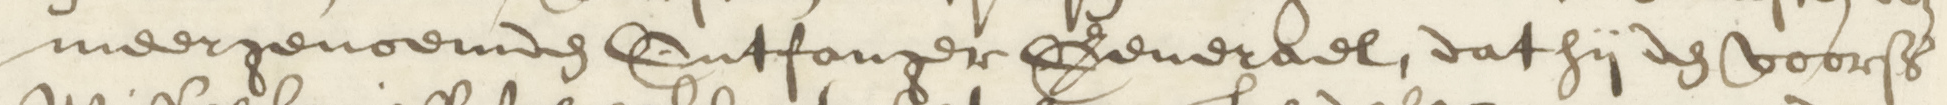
meergenoemden Ontfanger Generael, dat hij den voors
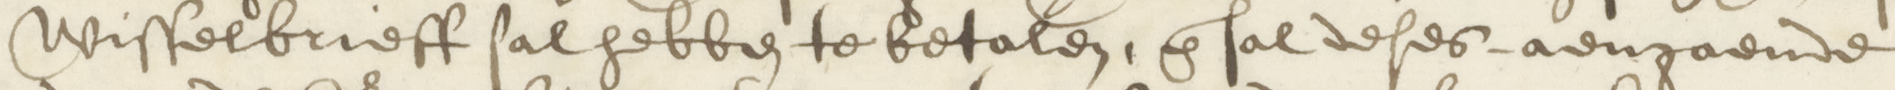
wisselbrieff sal hebben te betalen & sal deses aengaende
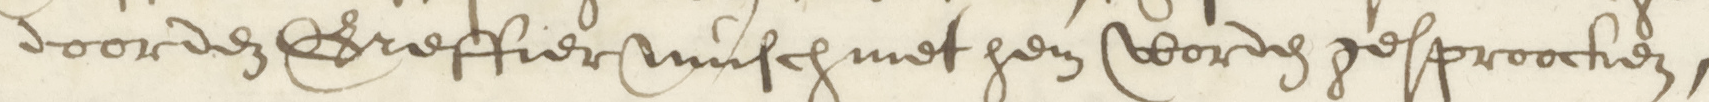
doorden Greffier Musch met hem worden gesproocken.
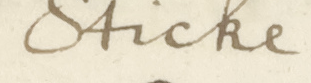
Sticke
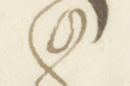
ca
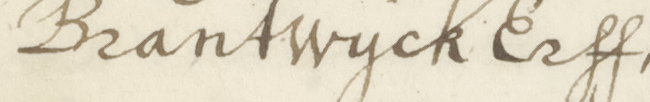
Brantwijck Erff„
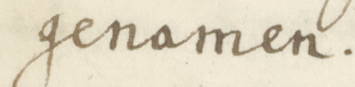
genamen.
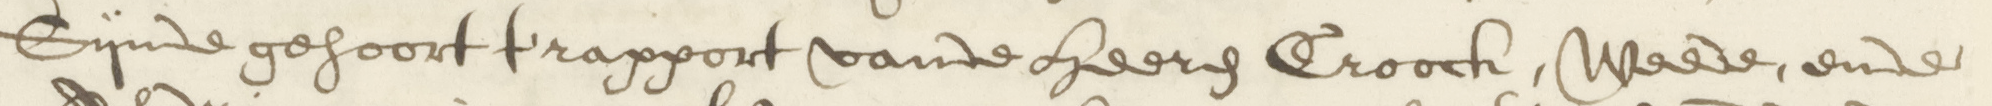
Sijnde gehoort t'rapport vande heeren Croock, Weede ende
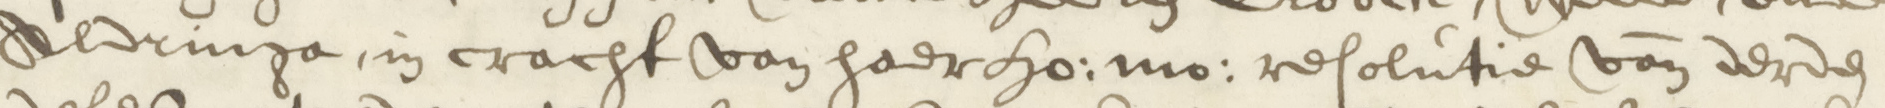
Aldringa, in cracht van haer Ho:Mo: resolutie van derden
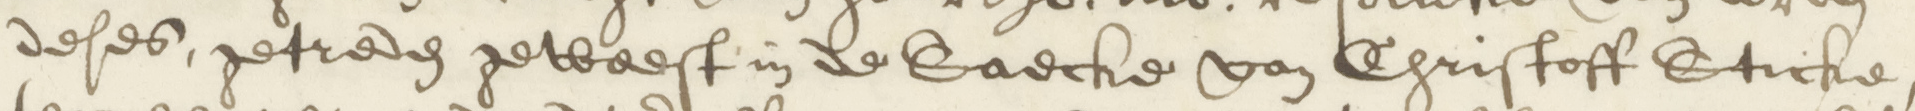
deses, getreden geweest in de Saecke van Christoff Sticke,
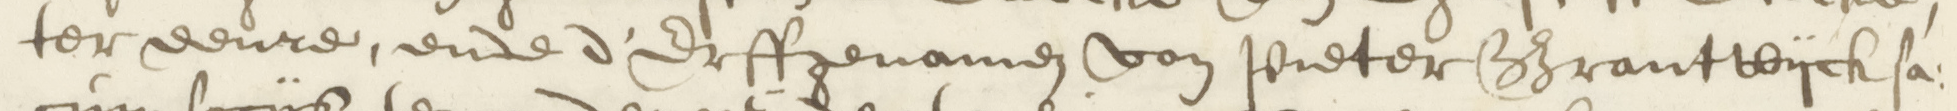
ter eenre, ende d'Erffgenamen van Pieter Brantwijck sa.
